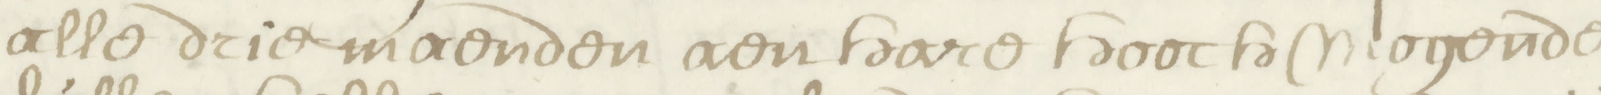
alle drie maenden aen hare hooch Mogende
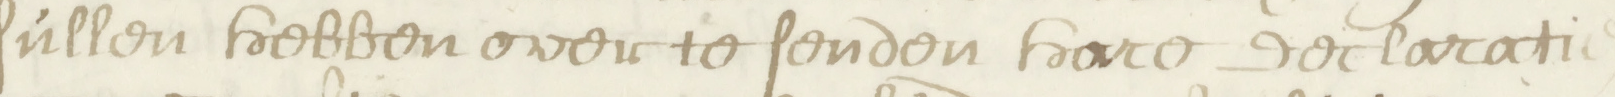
sullen hebben over te senden hare declaratien
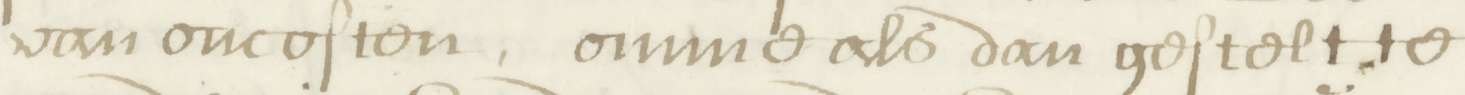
van oncosten, omme als dan gestelt te
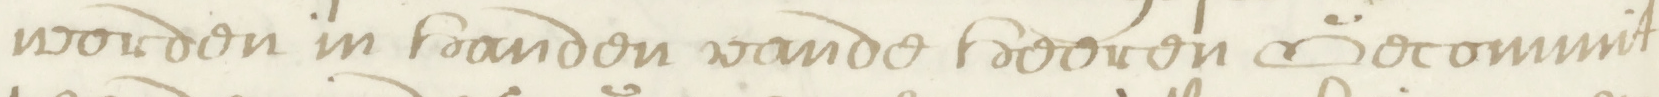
worden in handen vande heeren Gecommit„
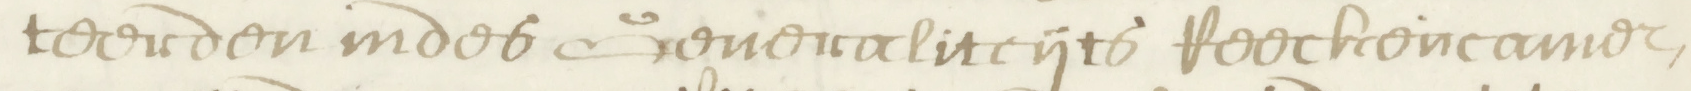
teerden indes Generaliteijts Reeckencamer,
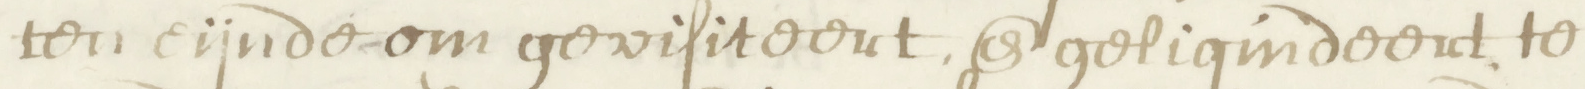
ten eijnde om gevisiteert & geliquideert te
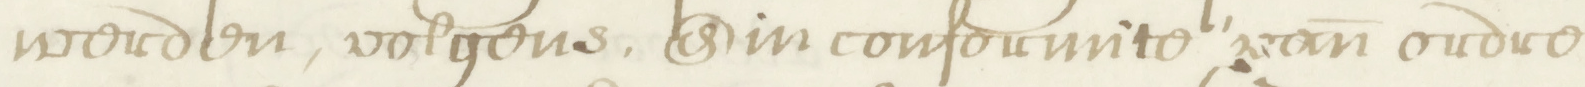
werden, volgens, & in conformité van ordre
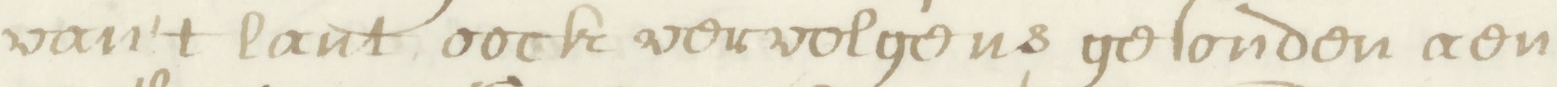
van't lant oock vervolgens gesonden aen
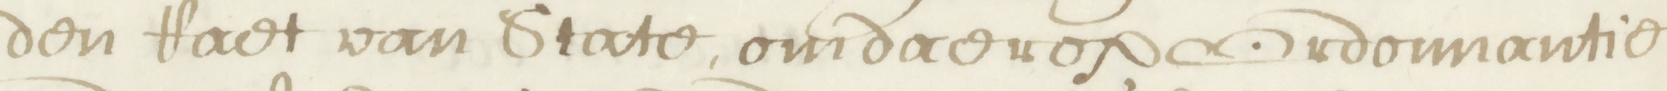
den Raet van State om daerop Ordonnantie
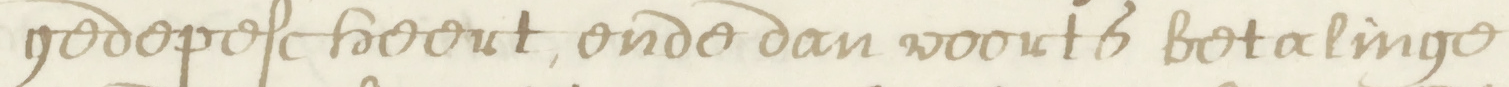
gedepescheert, ende dan voorts betalinge
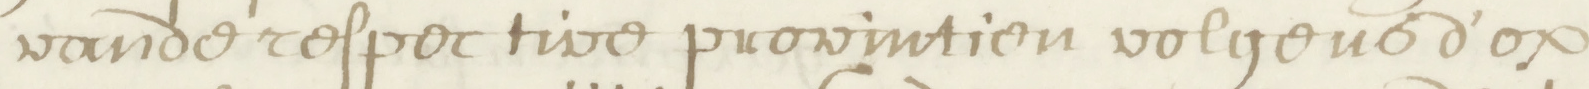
vande respective provintien volgens d'op
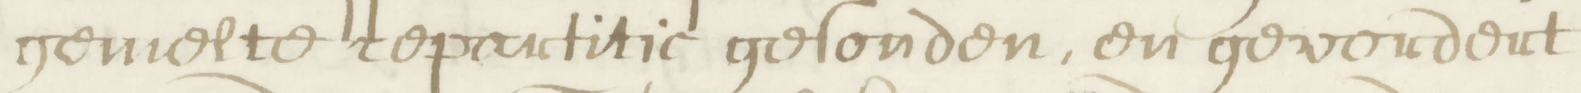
gemelte repartitie gesonden, en gevordert
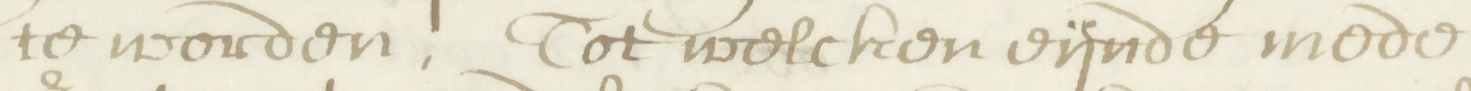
te worden. Tot welcken eijnde mede
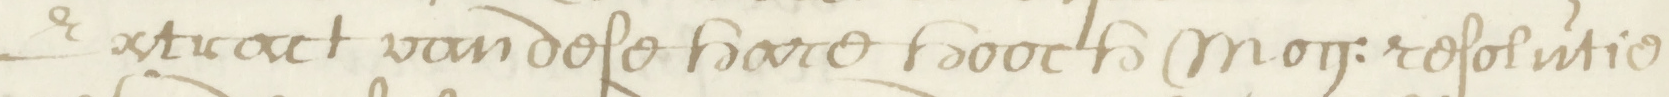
Extract van dese hare hooch Mog: resolutie
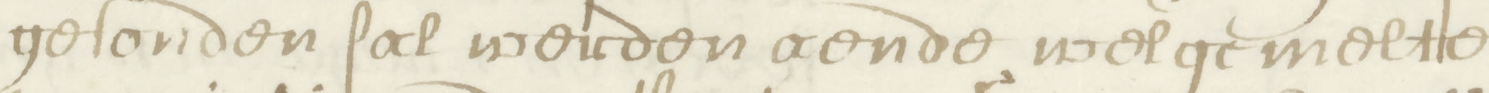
gesonden sal werden aende welgemelte
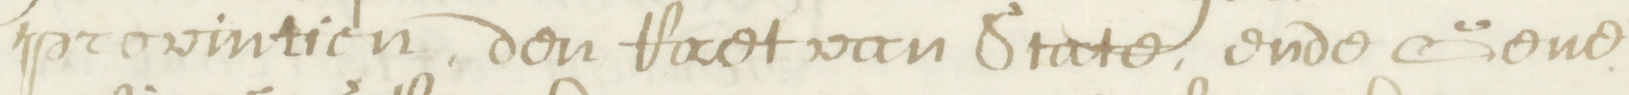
provintien, den Raet van State, ende Gene„
